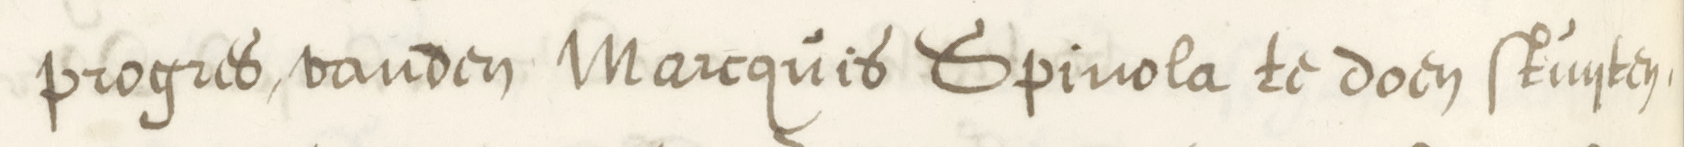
progres vanden Marcques Spinola te doen stuyten
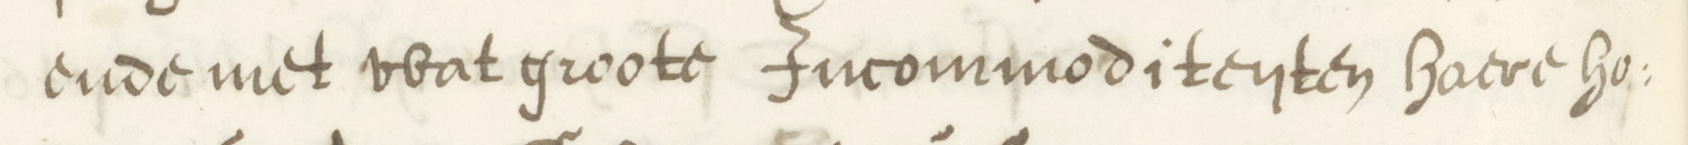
ende met wat groote Incommoditeyten haere Ho:
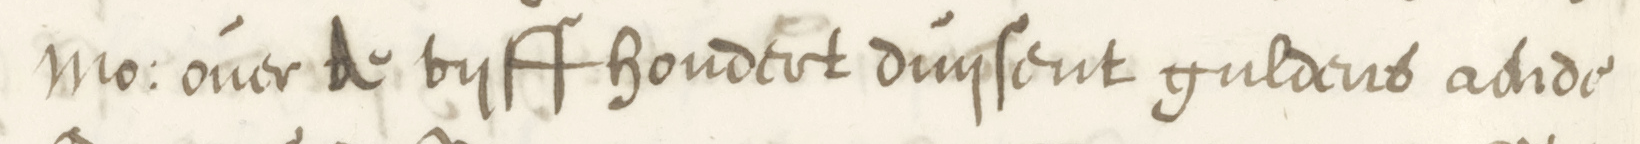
Mo: over de vyff hondert duysent guldens aende
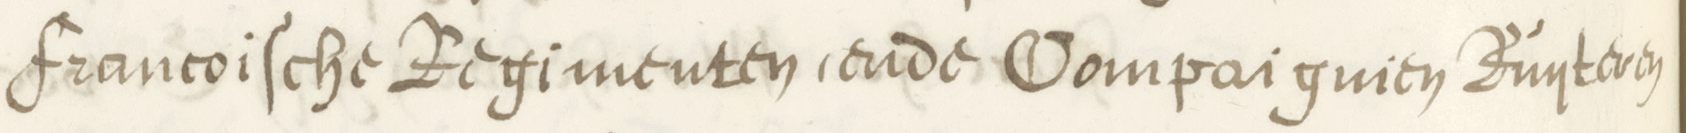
Francoische Regimenten, ende Compaignien Ruyteren
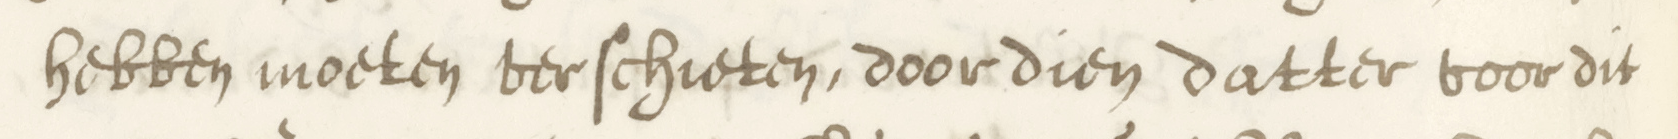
hebben moeten verschieten, door dien datter voor dit
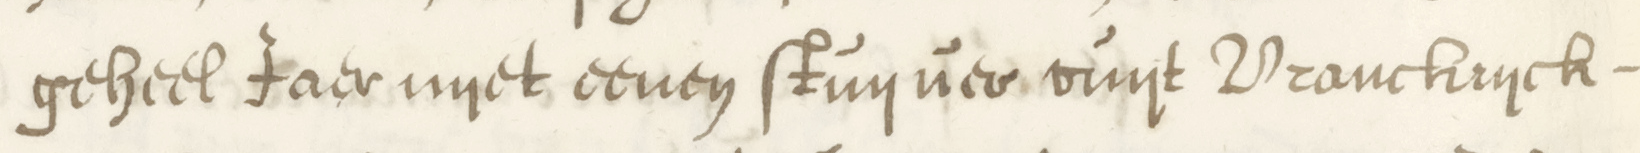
geheel Jaer nyet eenen stuyuer vuyt Vranckryck
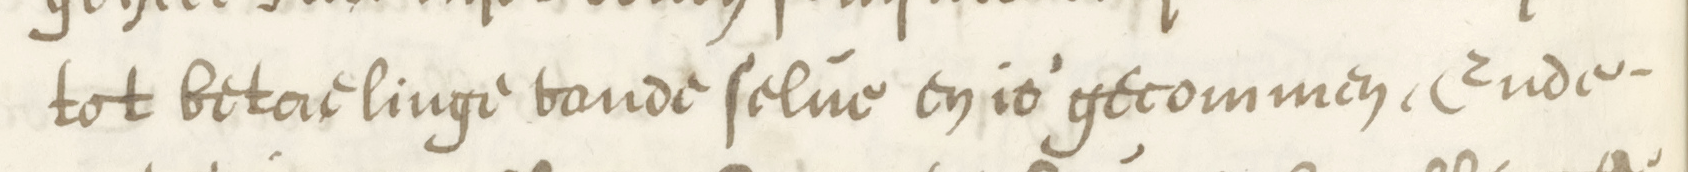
tot betaelinge vande selue en is gecommen. Ende
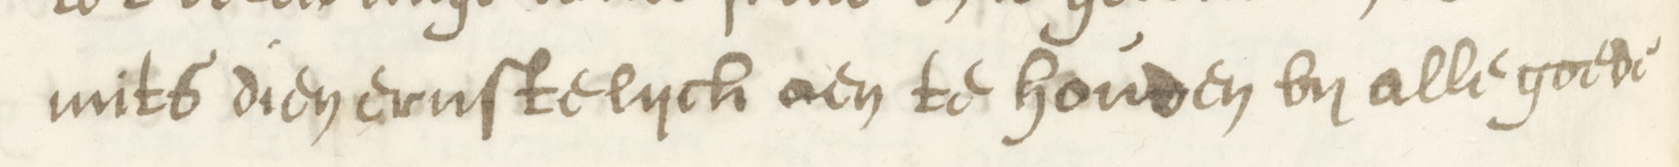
mits dien ernstelyck aen te houden by alle goede
